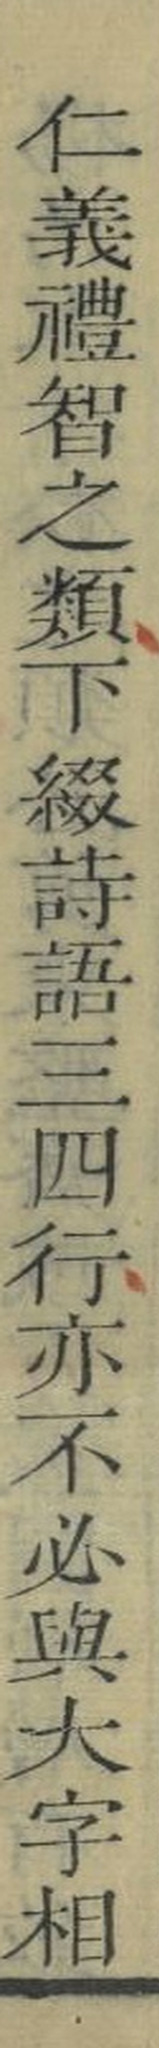仁義礼智之類下綴詩語三四行亦不必与大字相

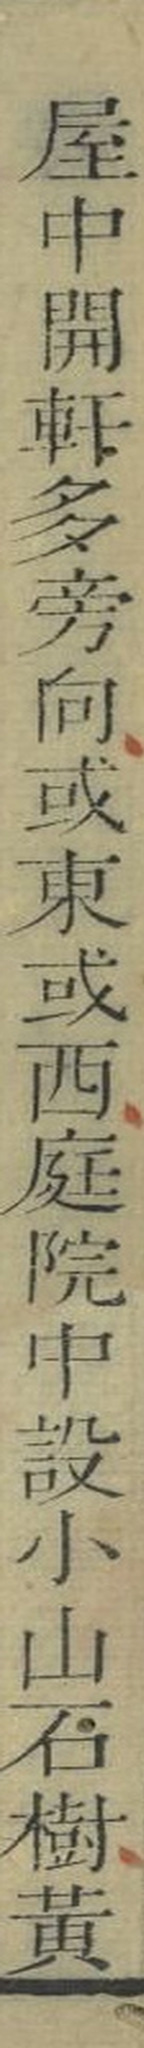屋中開軒多旁向或東或西庭院中設小山石樹黄
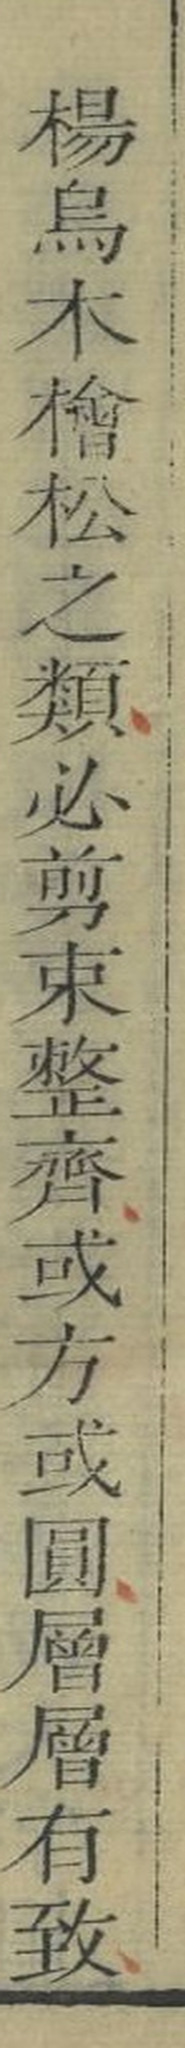楊烏木檜松之類必剪束整斉或方或円層層有致
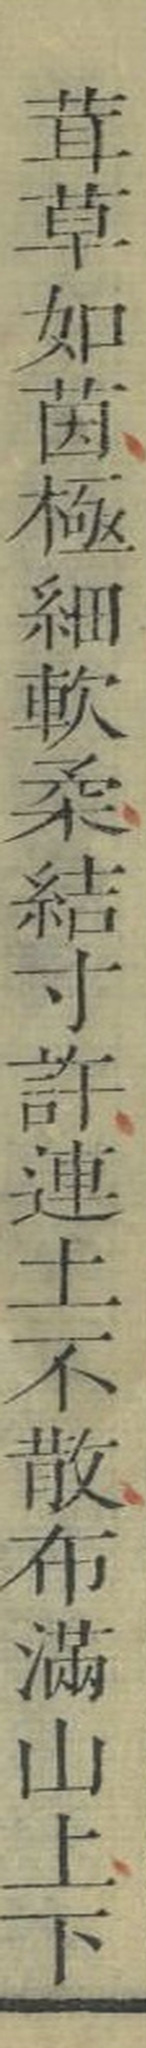茸草如茵極細軟柔結寸許連土不散布満山上下
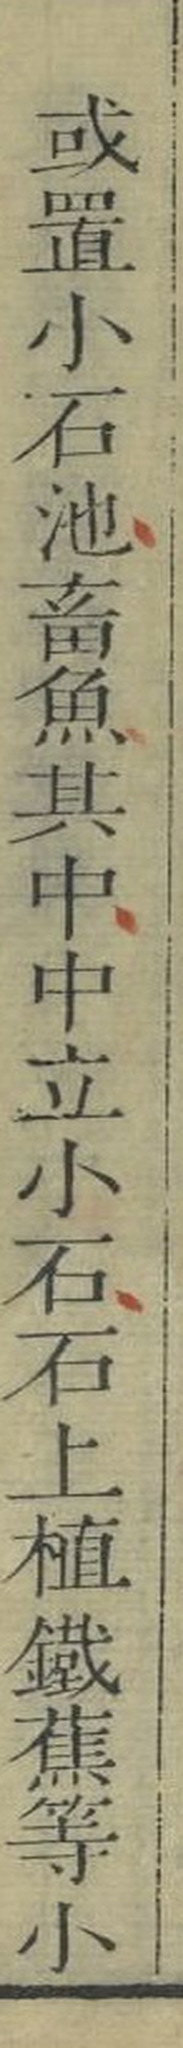或置小石池畜魚其中中立小石石上植鉄蕉等小
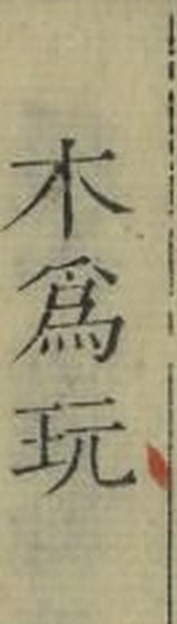木為玩
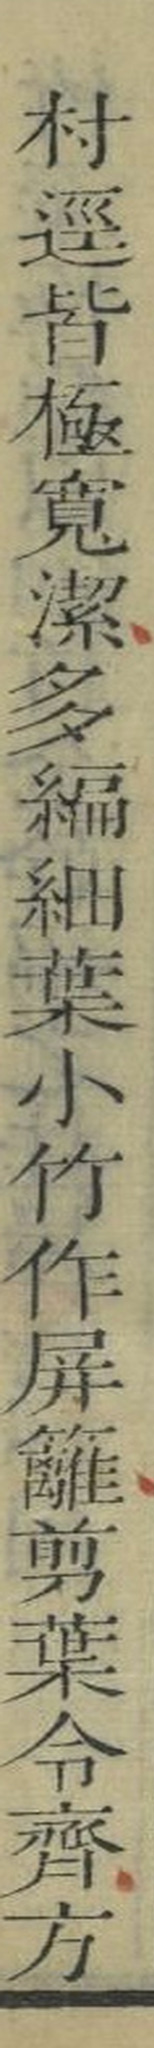村逕皆極寛潔多編細葉小竹作屛籬剪葉令斉方
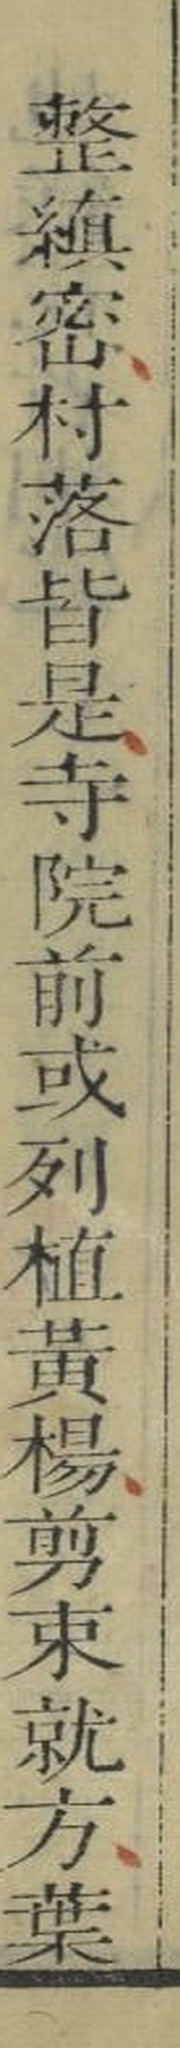整縝密村落皆是寺院前或列植黄楊剪束就方葉
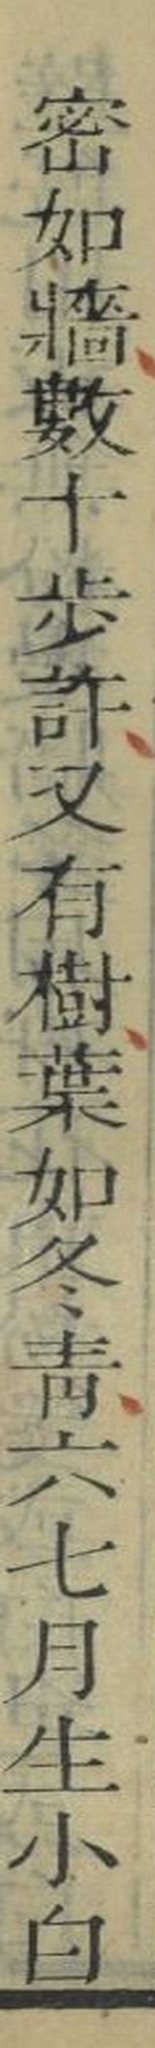密如牆数十歩許又有樹葉如冬青六七月生小白
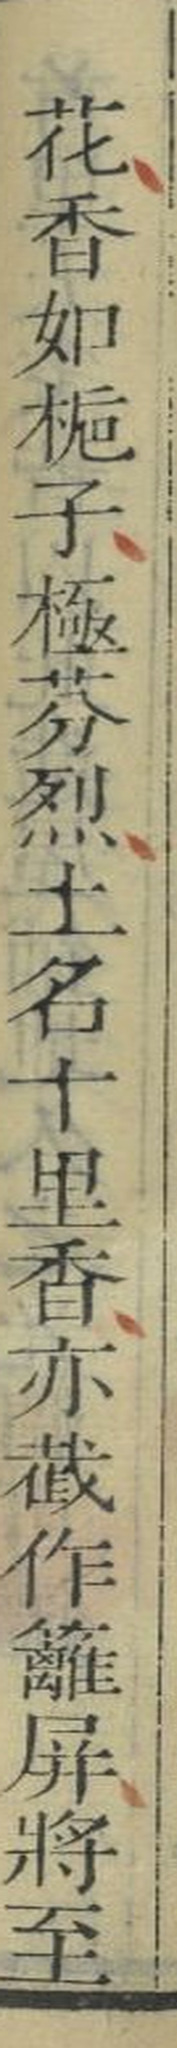花香如梔子極芬烈土名十里香亦截作籬屛将至
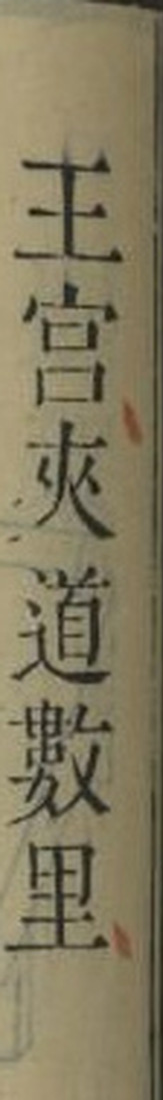王宮夾道数里
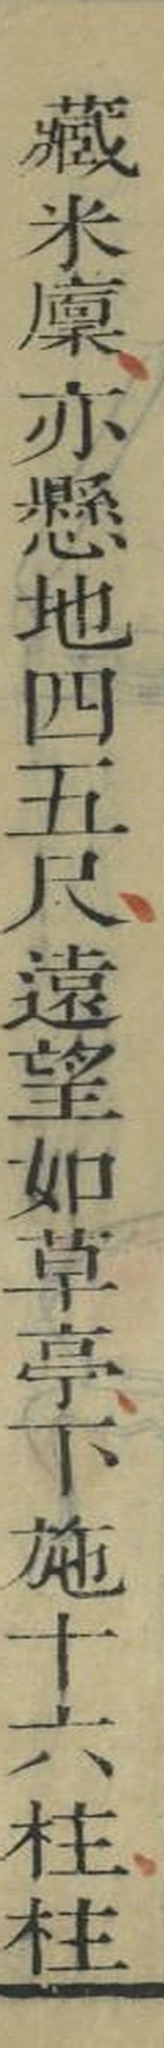蔵米廩亦懸地四五尺遠望如草亭下施十六柱柱
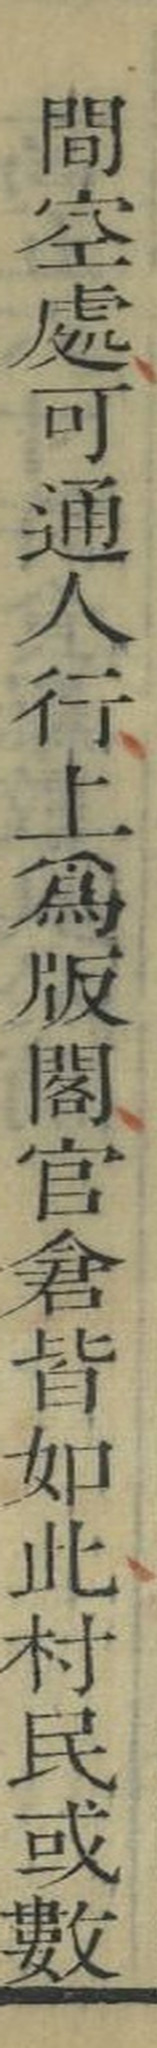間空処可通人行上為版閣官倉皆如此村民或数
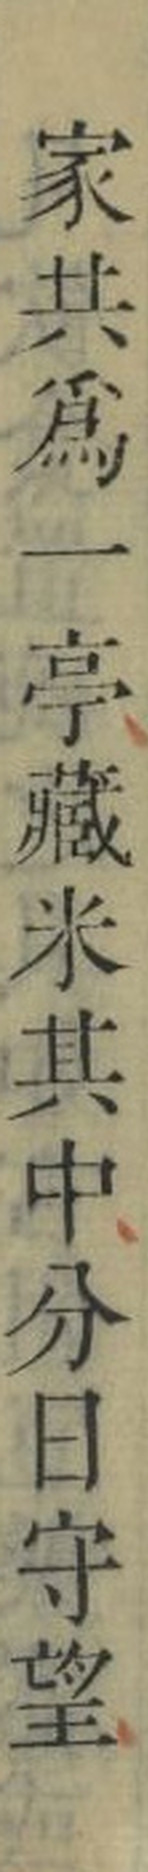家共為一亭蔵米其中分日守望

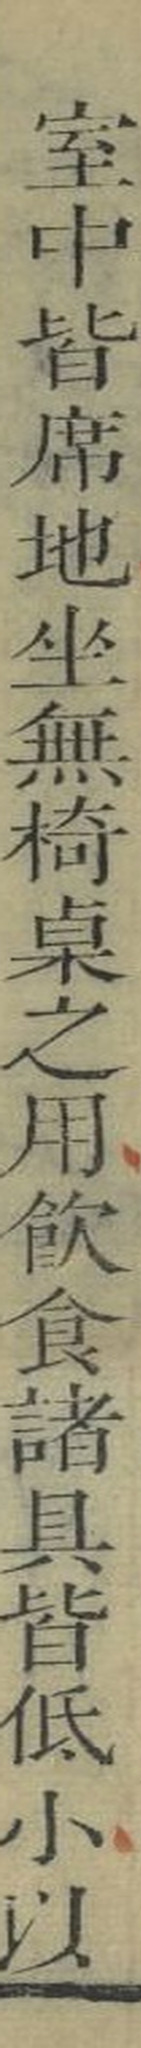室中皆席地坐無椅桌之用飲食諸具皆低小以
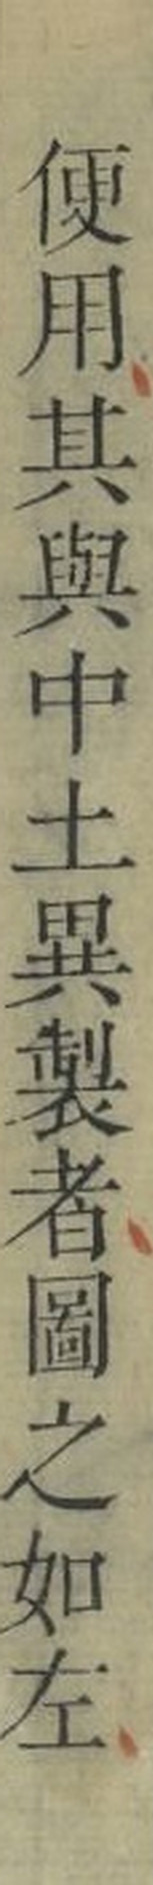便用其与中土異製者図之如左
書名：中山伝信録 巻六
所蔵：University of the Ryukyus Library
